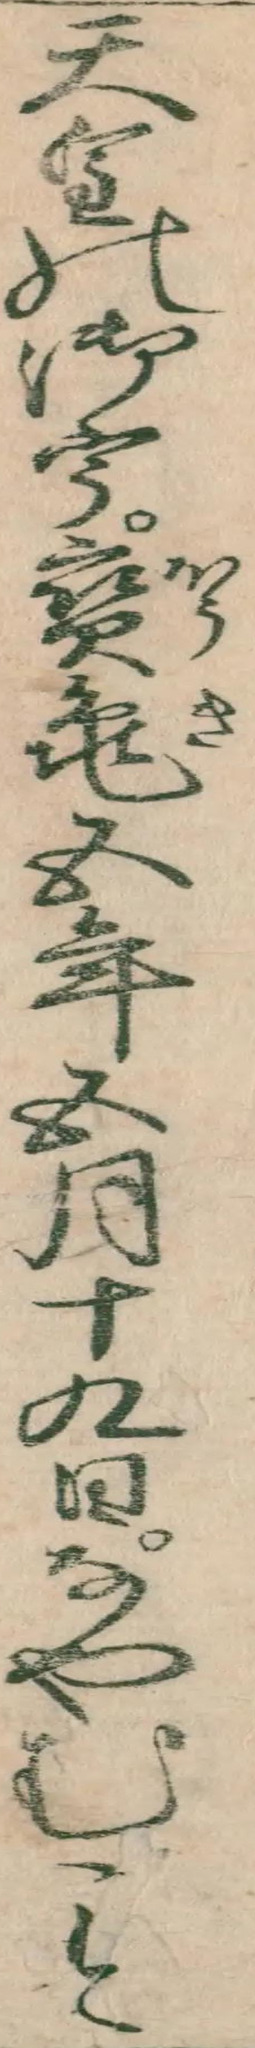天皇の御宇。宝亀五年五月十九日。なやむこと
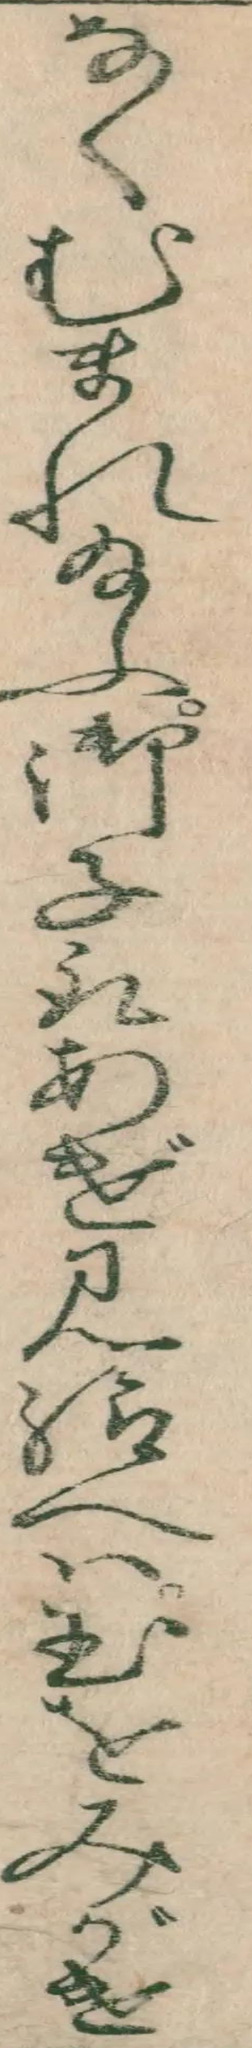なくむまれ給ふ。御子取あげ見給へは。玉をみがけ
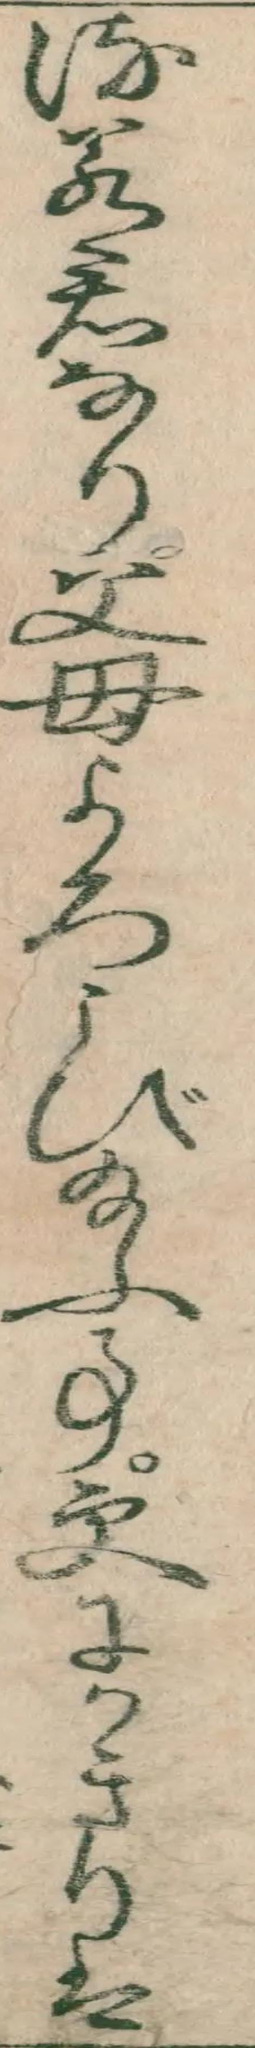る若君なり。父母よろこび給ふ事。更にかきりは
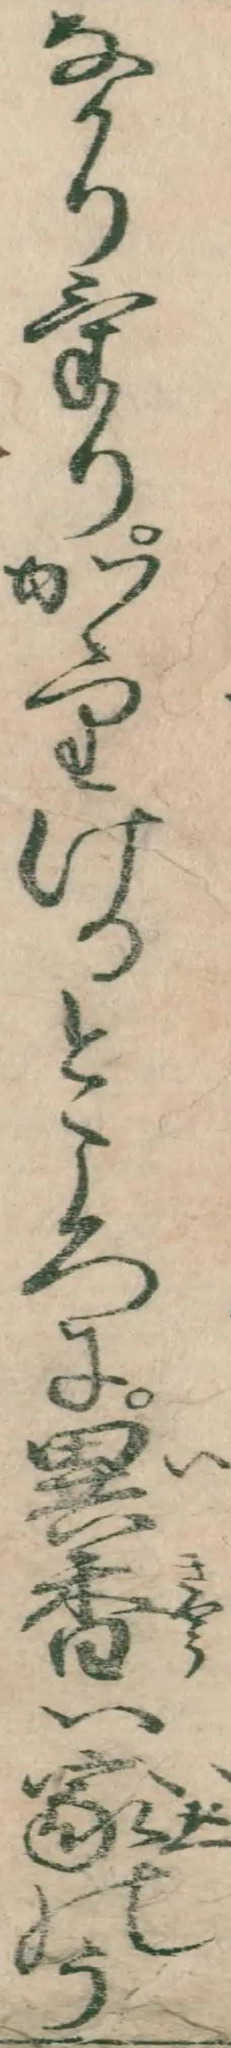なかりけり。かゝりけるところに。異香は家のう
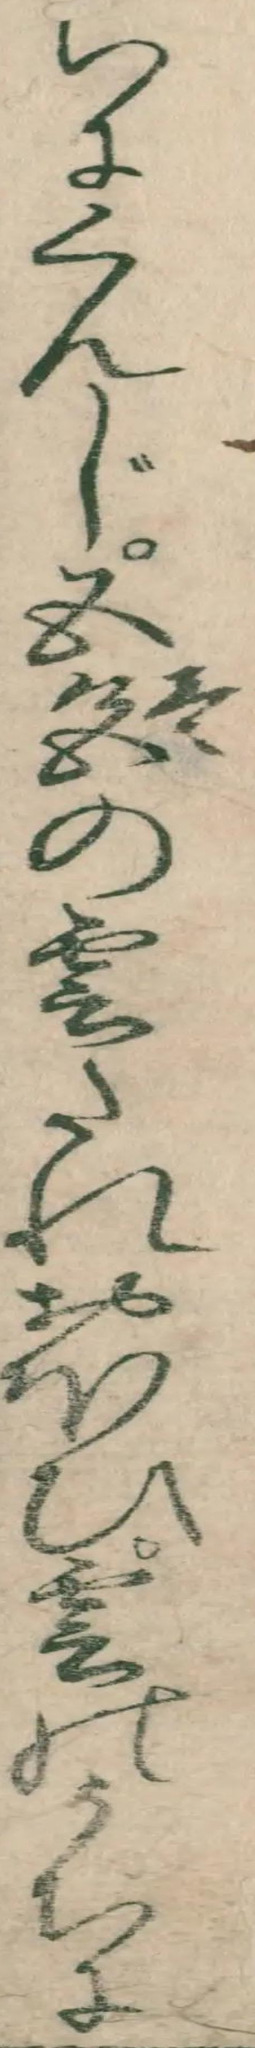ちにくんじ。五色の雲たれおほひ。雲のうちに

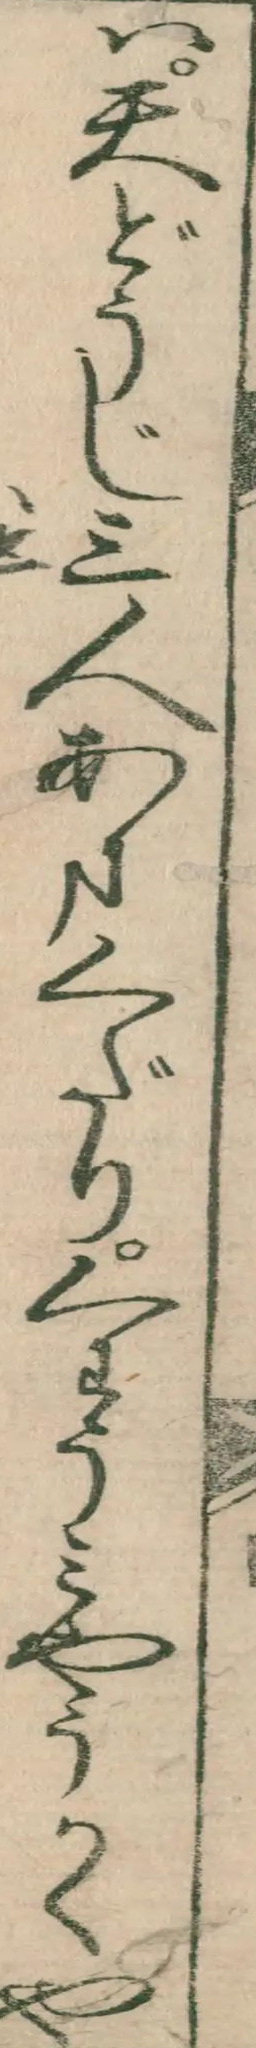は。天どうじ三人あまくだり。くわうみやうかくや
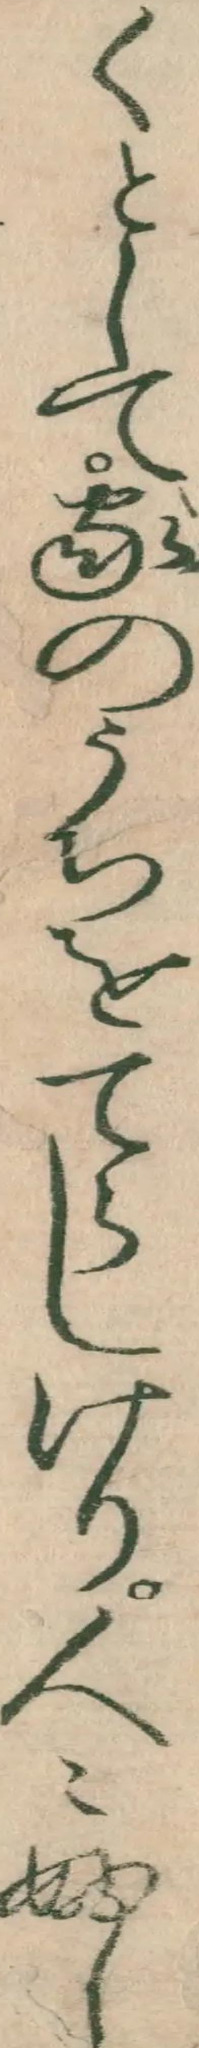くとして。家のうちをてらしけり。人々ふし
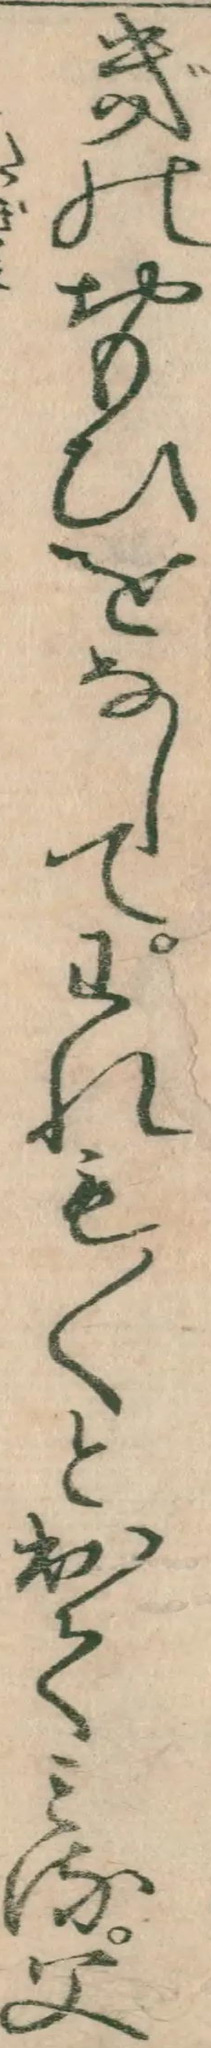ぎのおもひをなして。われも〳〵と出てみる。父
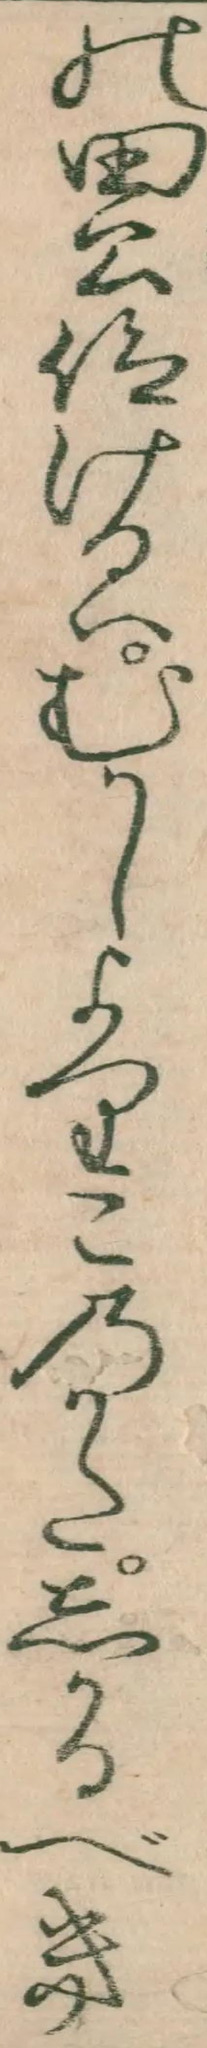の田公仰けるは。むかしよりこのかた。しかるべき
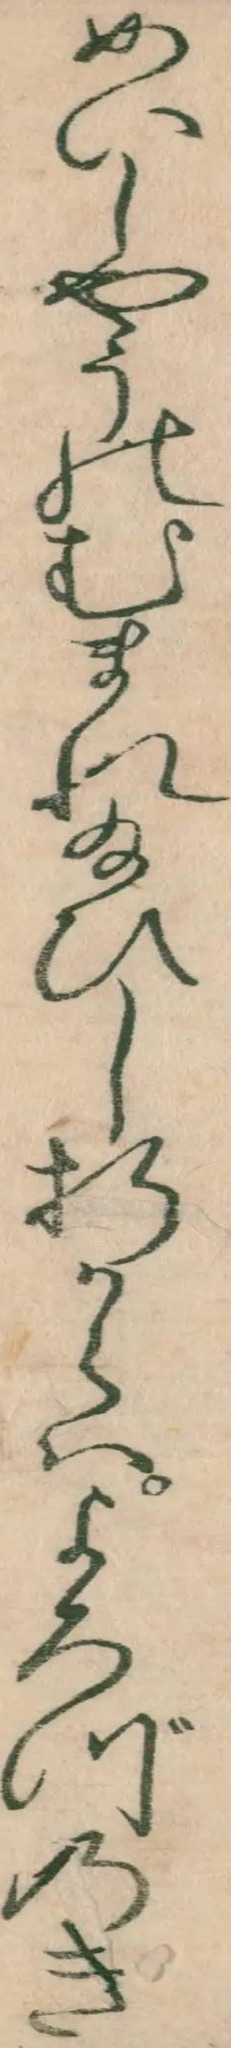めいしやうのむまれ給ひし折からは。よろづのき
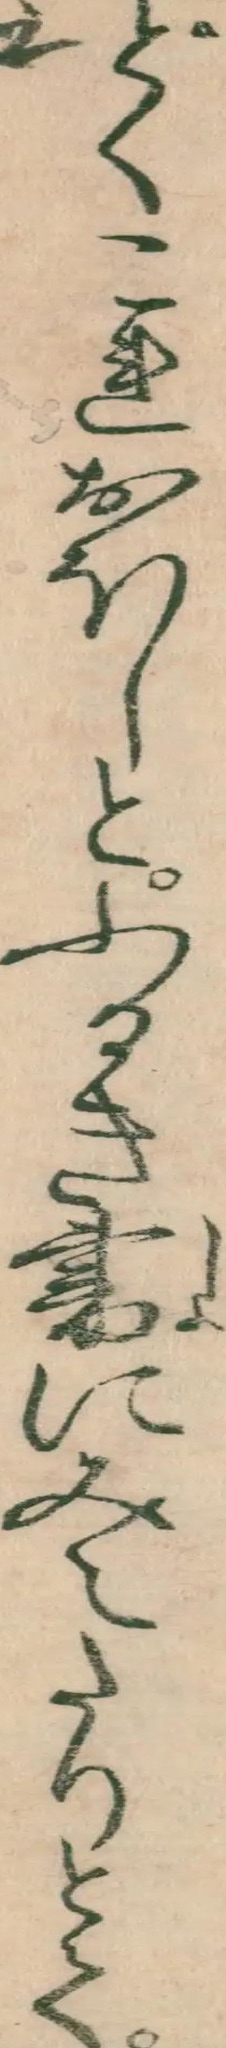どくこれおほしと。ふるき書にみえたりとて。
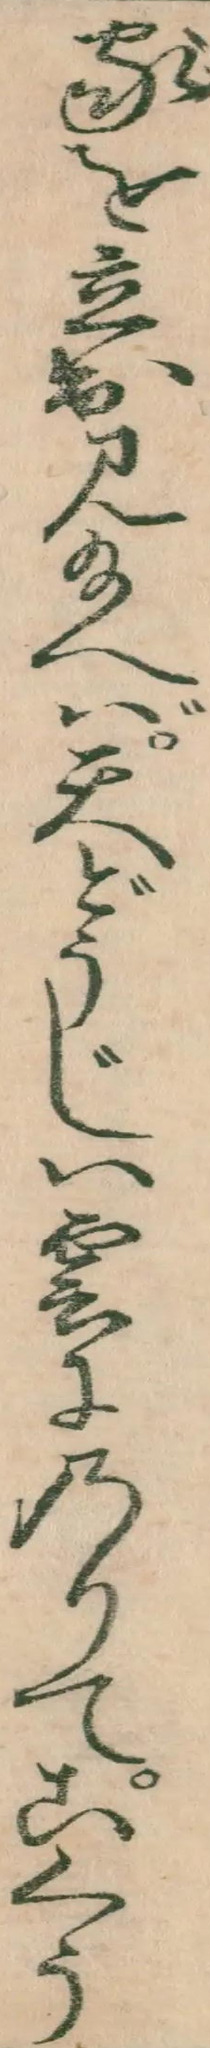家を立出見給へば。天どうじは雲にのりて。こくう
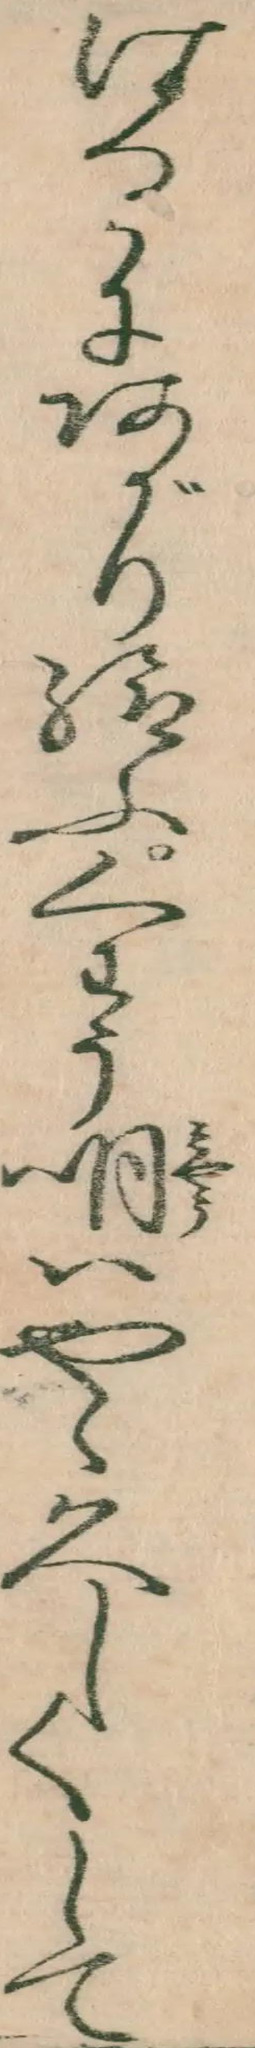はるかにあがり給ふ。くわう明はやゝ久しくして
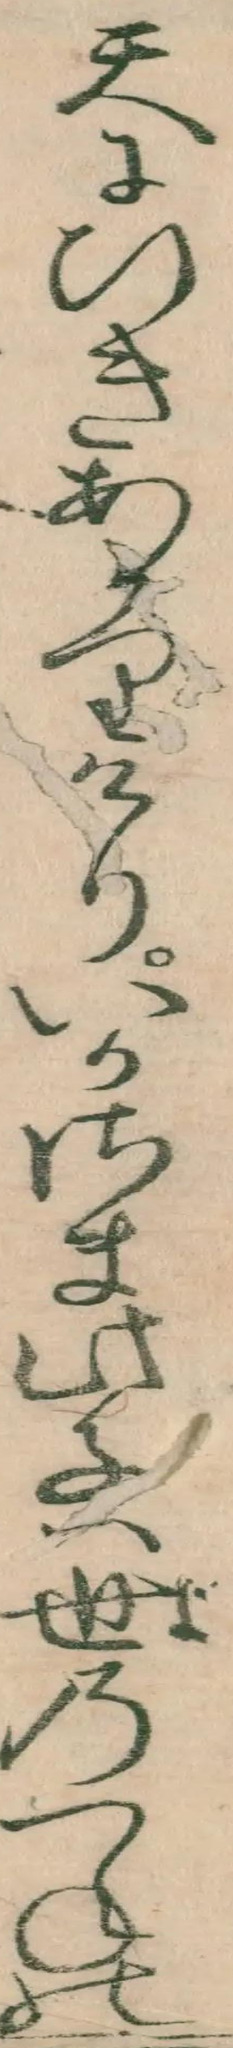天にひきあかりけり。いかさま此子は世のつねの
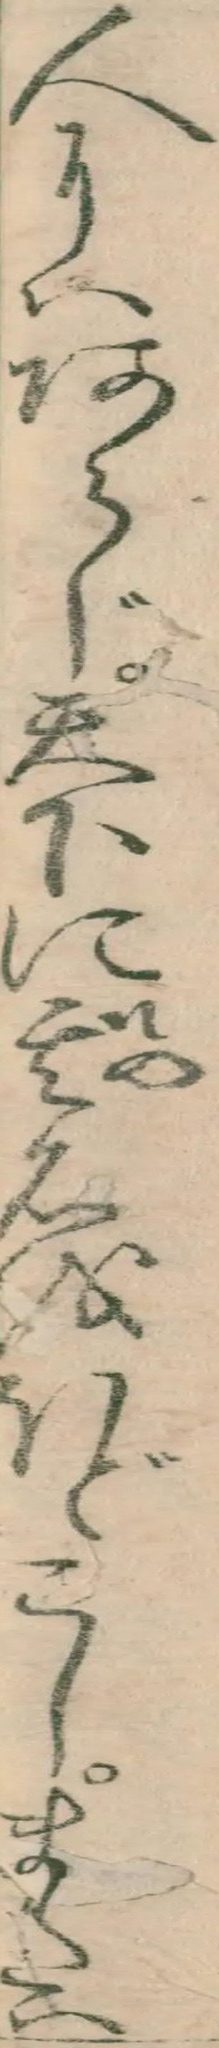人にはあらじ。天下に其名をほどこし。または
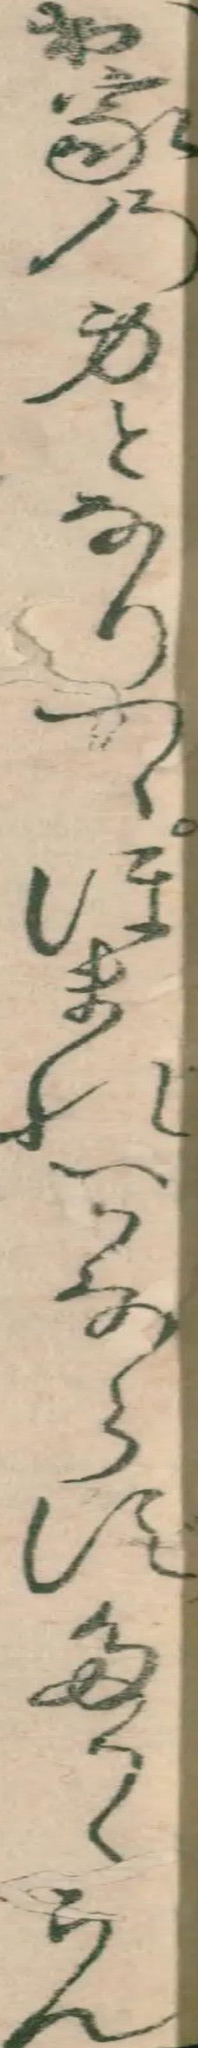出家の身となりつゝ。ほまれはかならすたかゝらん
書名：弘法大師御本地 3巻. [1]
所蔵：国立国会図書館 National Diet Library, JAPAN
